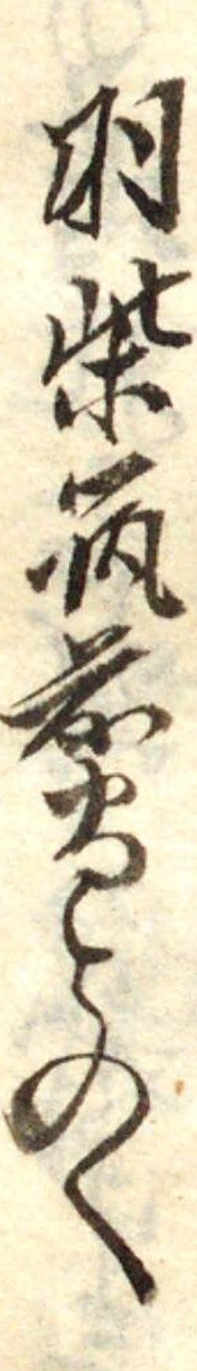羽柴筑前守とのへ

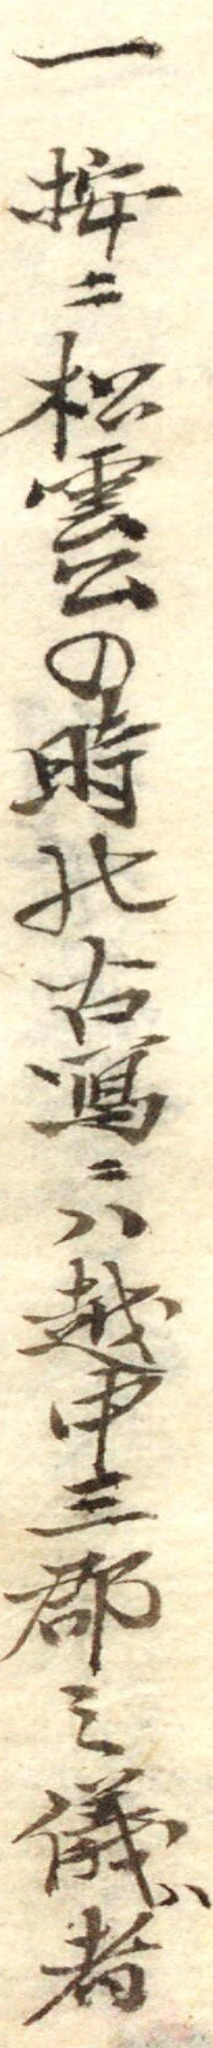一按に松雲公の時能古写には越中三郡之儀者
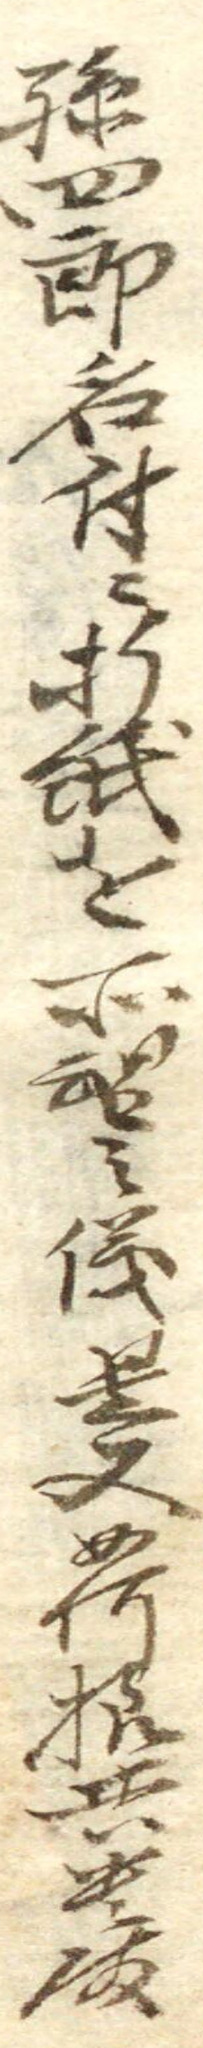孫四郎名付に折紙を所望之儀是又如何様共貴殿
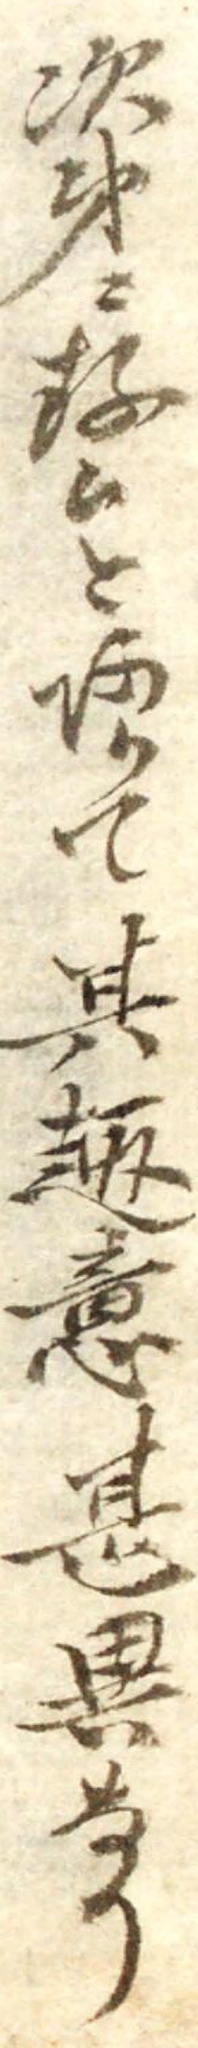次第に存候と阿りて其趣意甚異なり
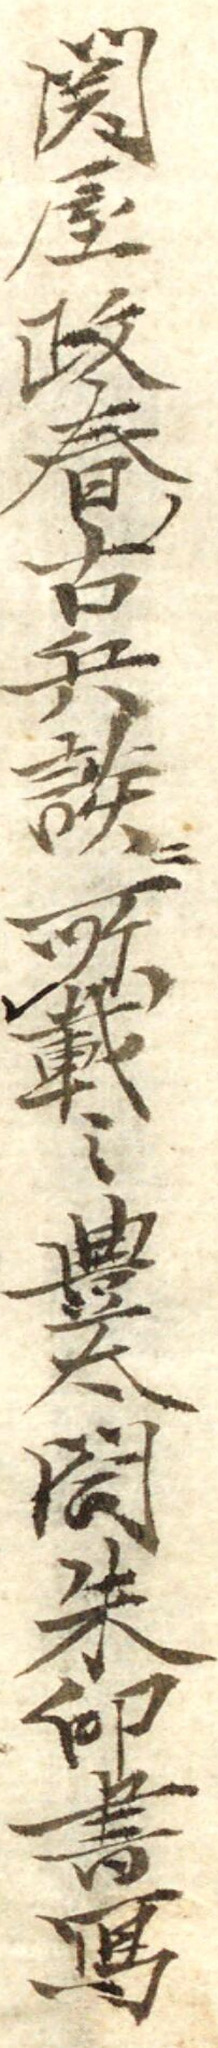関屋政春の古兵談に所載之豊太閤朱印書写
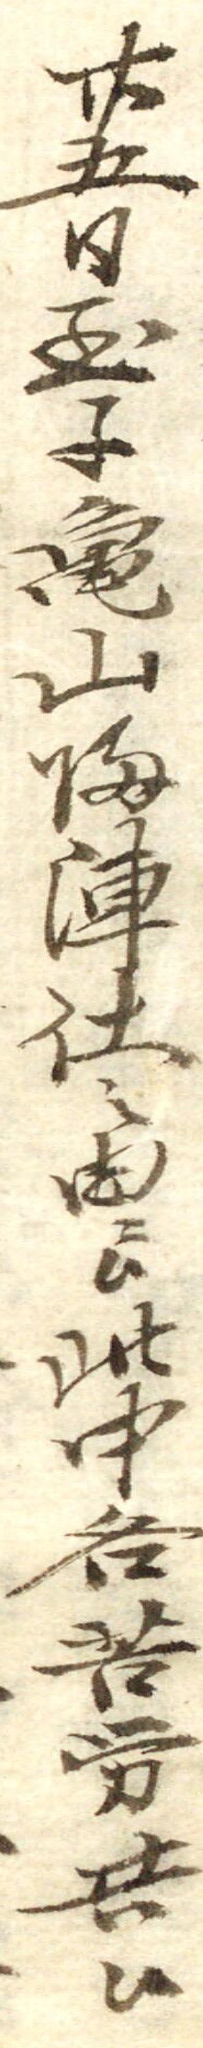廿五日至尓亀山帰陣仕之由に候此中各苦労共候
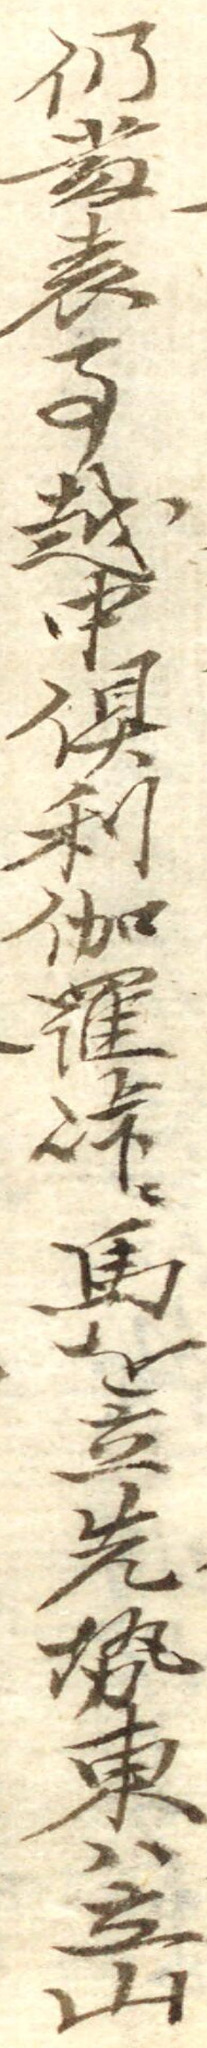仍当表事越中倶利伽羅峠に馬を立先勢東は立山
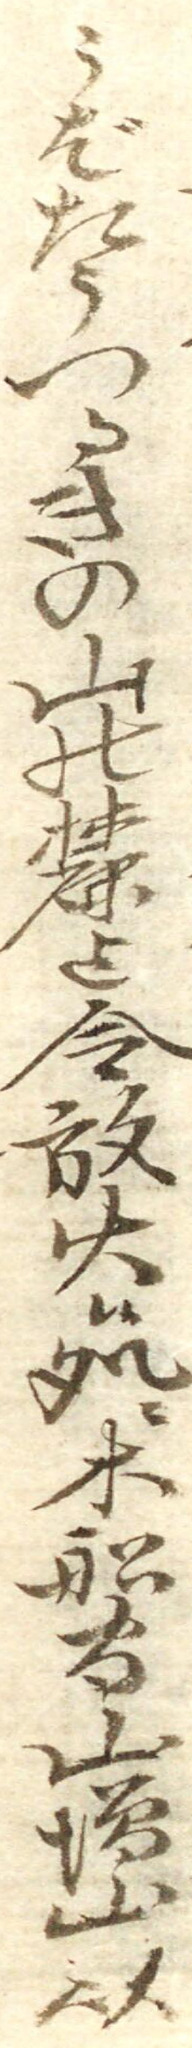うばたうつるきの山能麓迄令放火候処に木舩守山増山以
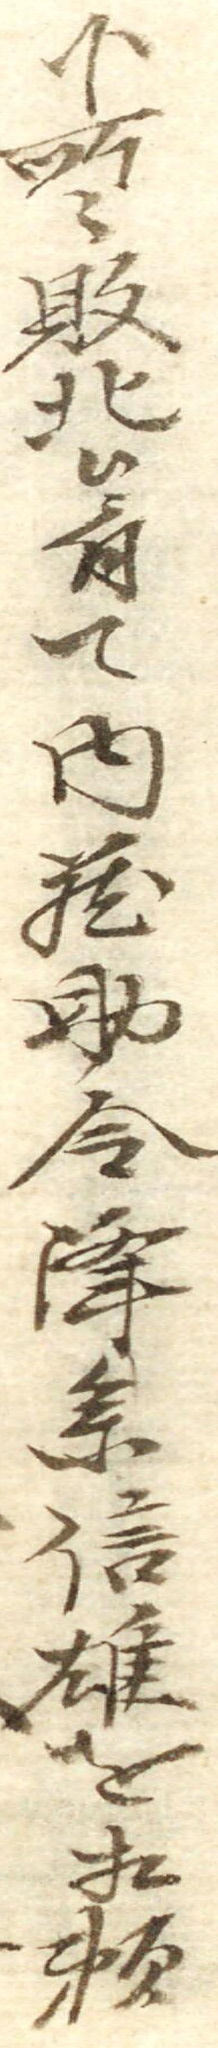下所々敗北候付て内蔵助令降参信雄を相頼
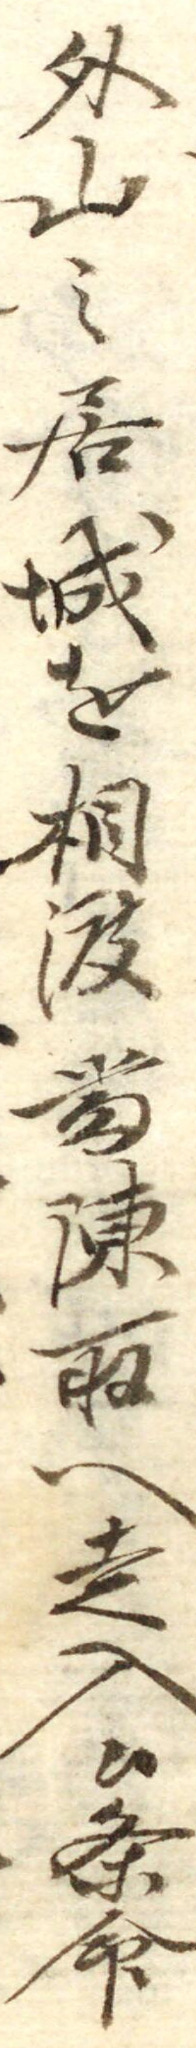外山之居城を相渡当陣所へ走入候条命
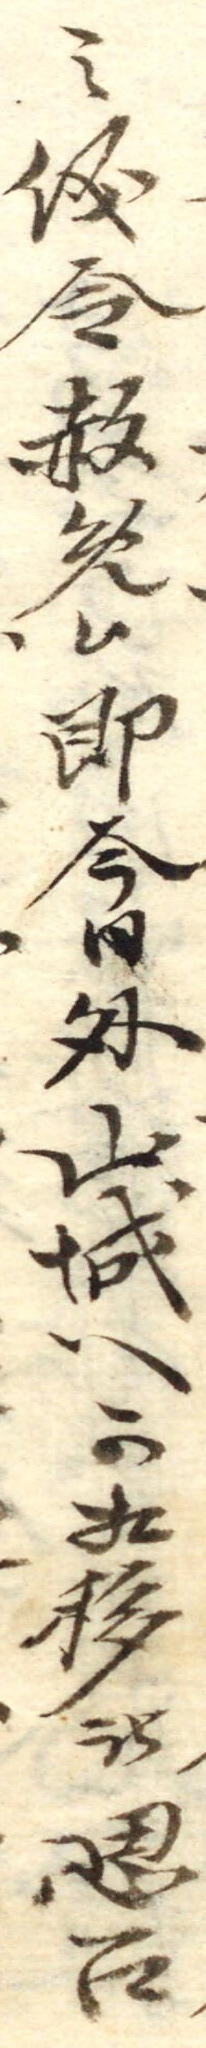之儀令赦免候即今日外山城へ可相移否被思召
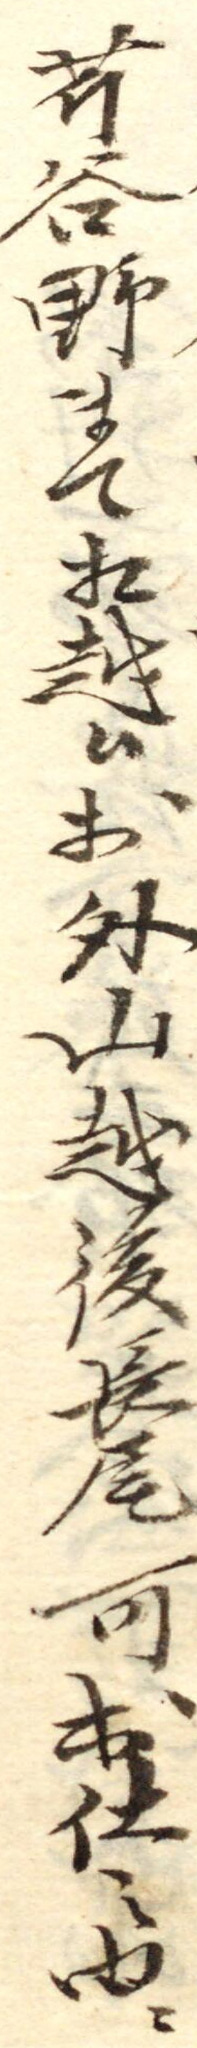芹谷野まて相越候お外山越後長尾可出仕之由に
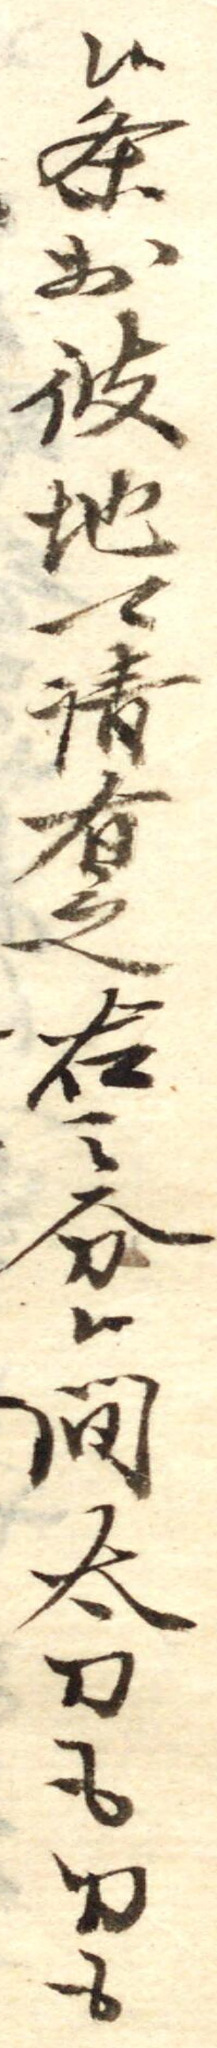候条お彼地可請有之右之分候間太刀も刀も
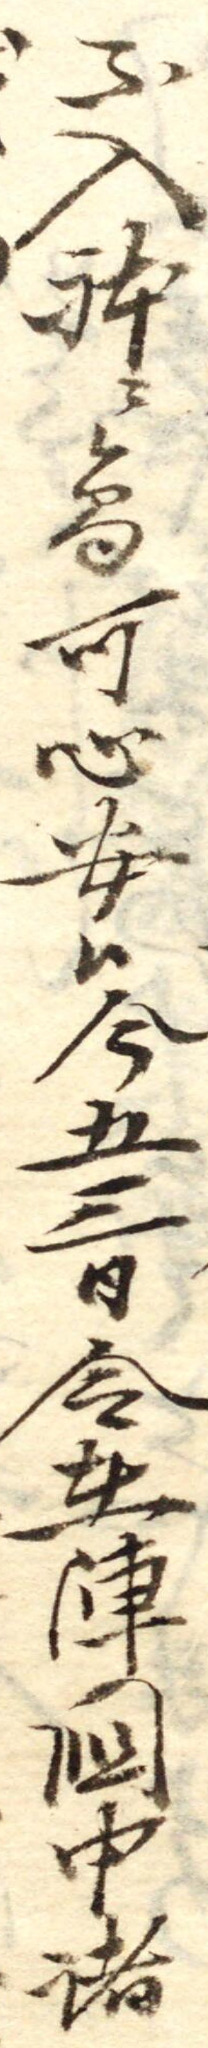ふ入躰に候間可心安候今五三日令在陣国中諸
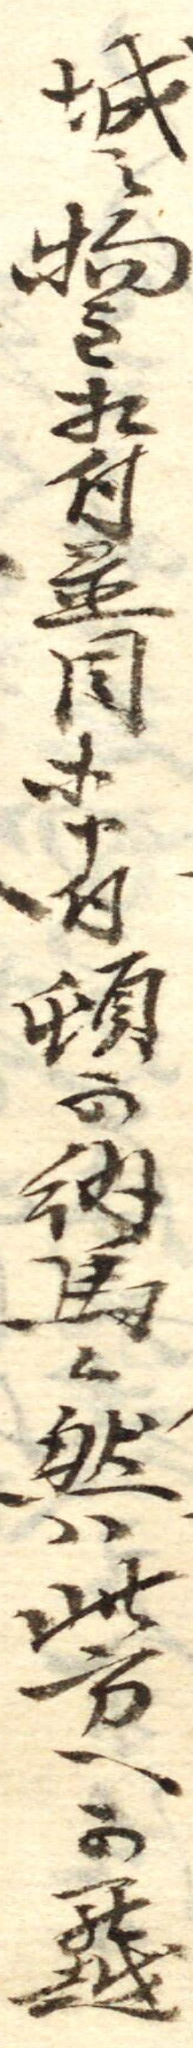城之物主相付置目等申付頓可納馬候然は此方へ可罷越
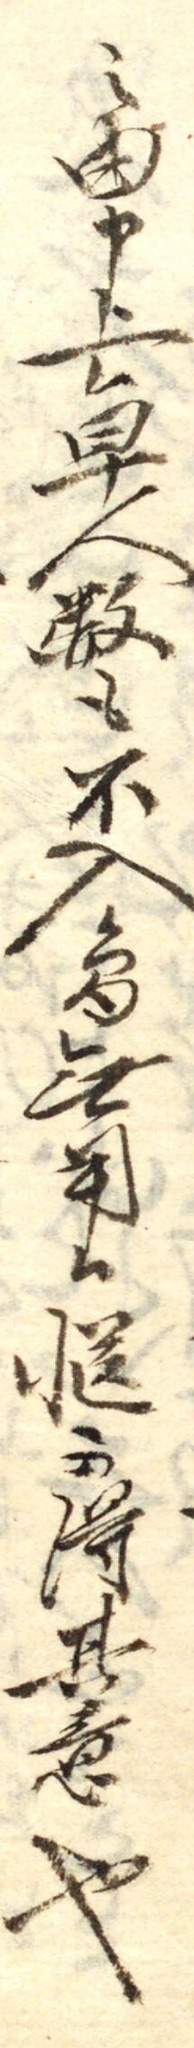之由申上候早人数も不入候間無用候慥可得其意也
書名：前田家封国証書集録
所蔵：Ishikawa Prefectural Library
